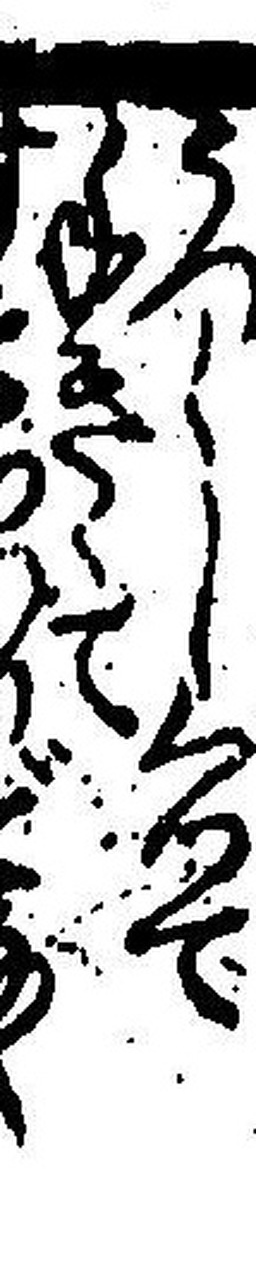手きゝて
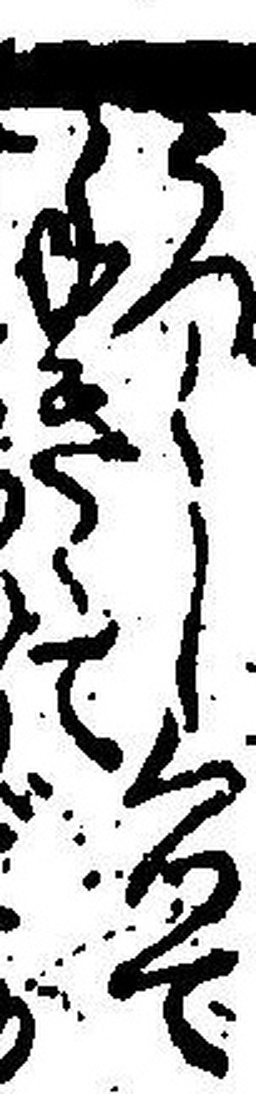手きゝて
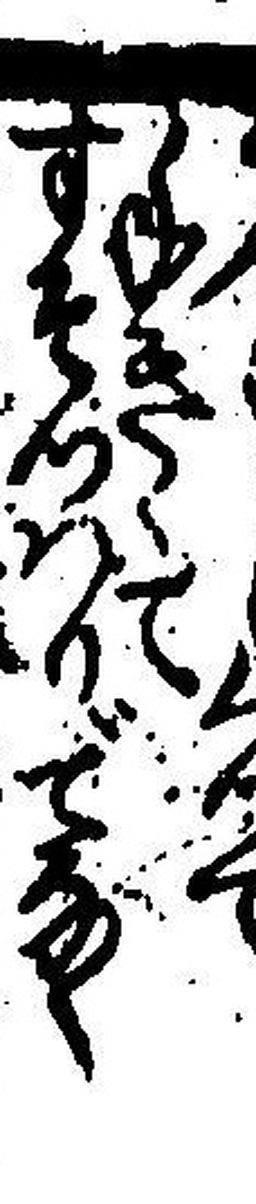すそつはりでなく
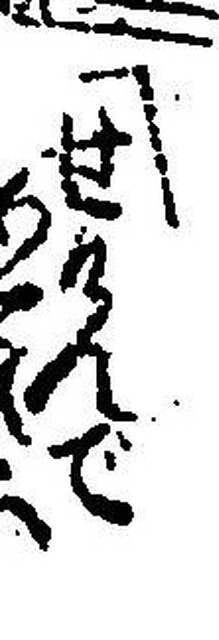〽せけんで
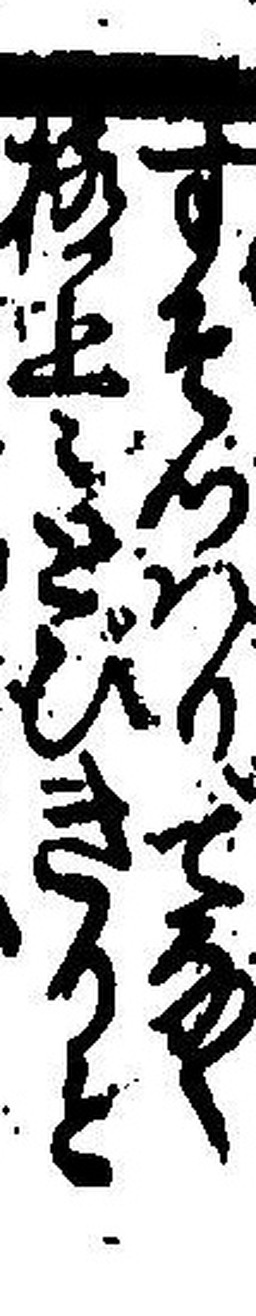極上々とびきりと
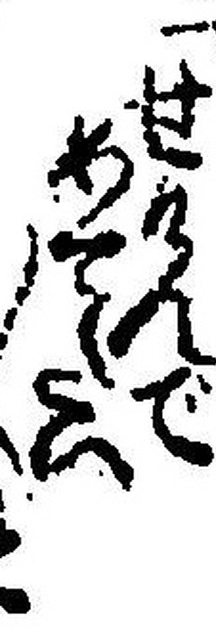めてたい
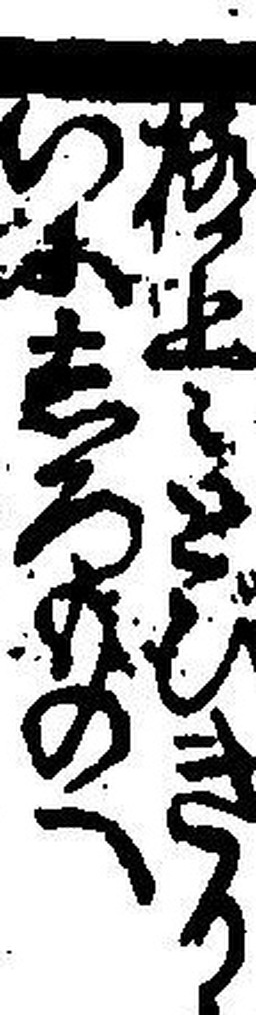いふしろものへ
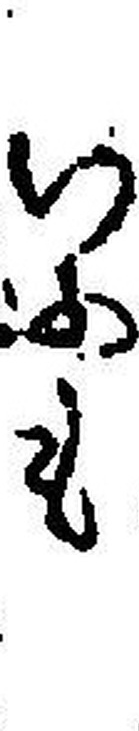いふも
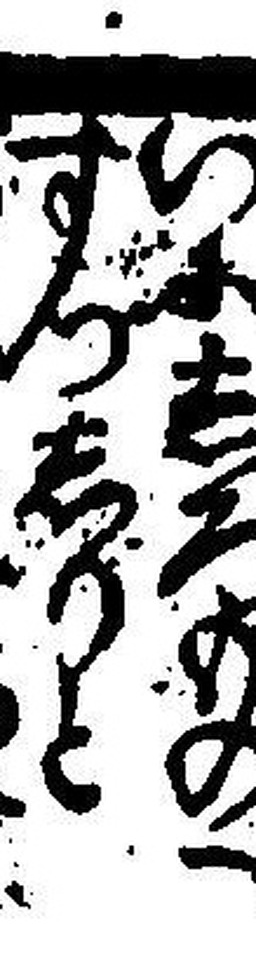すつしりと
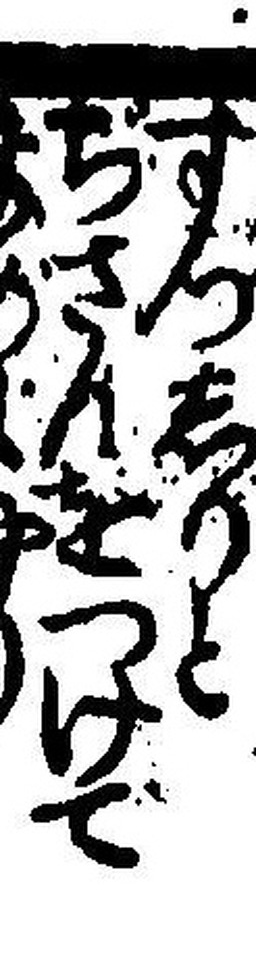ぢさんをつけて
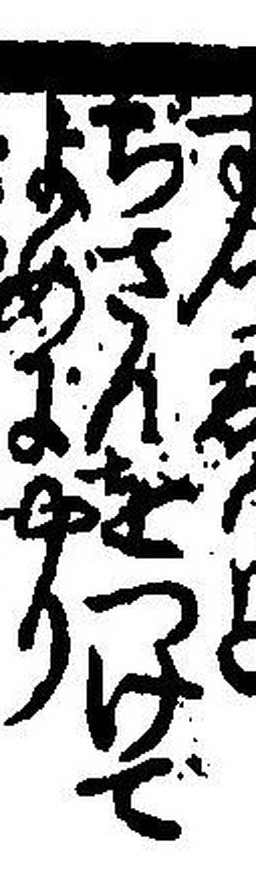ぢさんをつけて
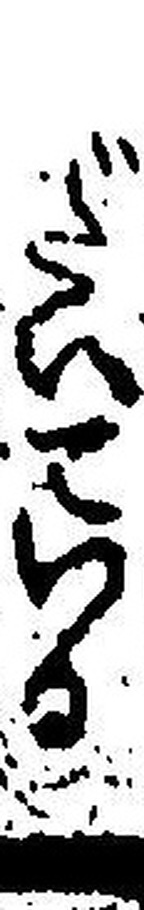だいている
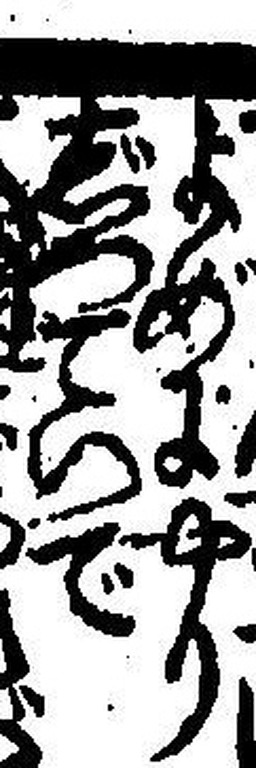じつていで
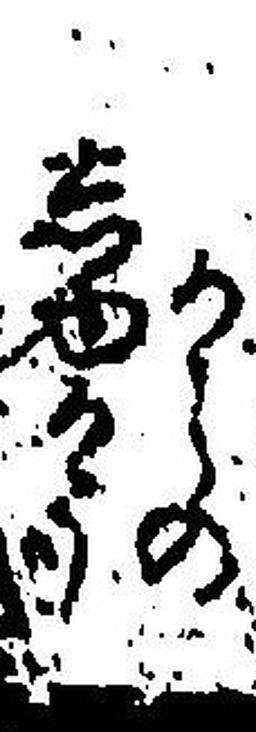しゆかう
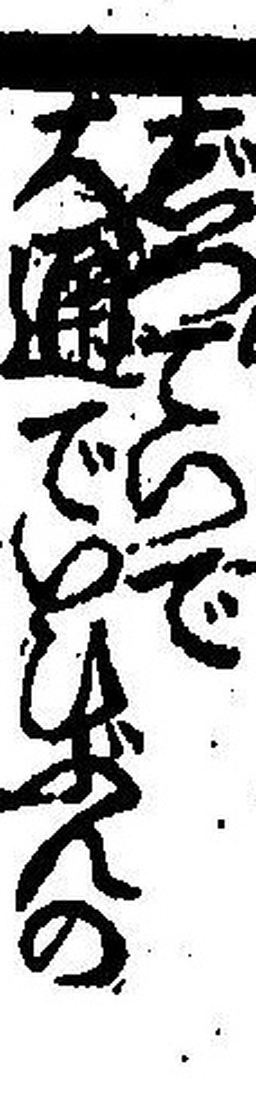大通でいひぶんの
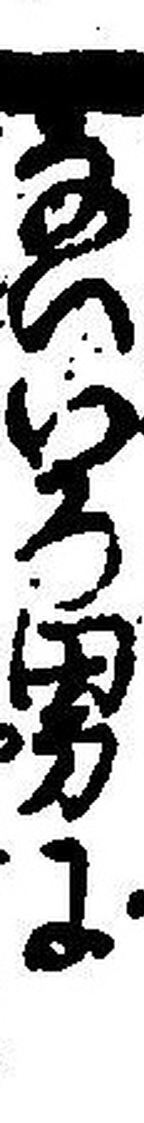ないいろ男に
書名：徳若水縁起金性 / 樹下石上作
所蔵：東京大学総合図書館 General Library in the University of Tokyo, JAPAN
